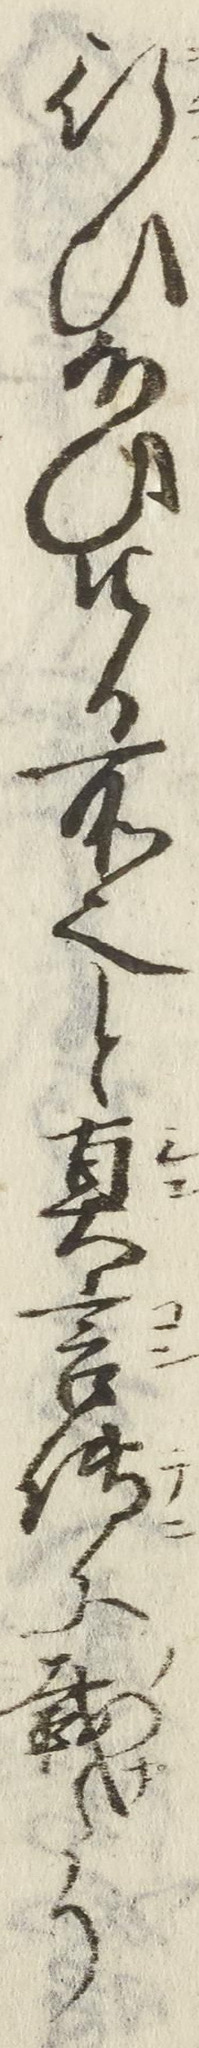行ひ給ひける所也と真言伝に載たり
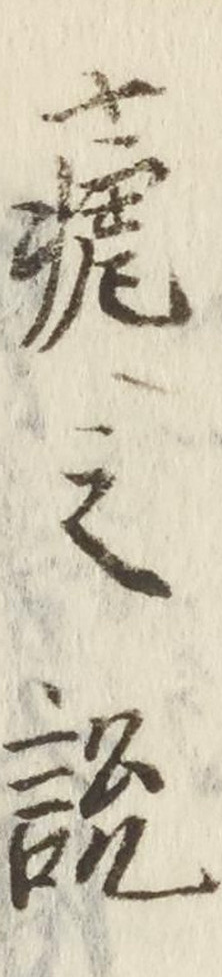瘧の説
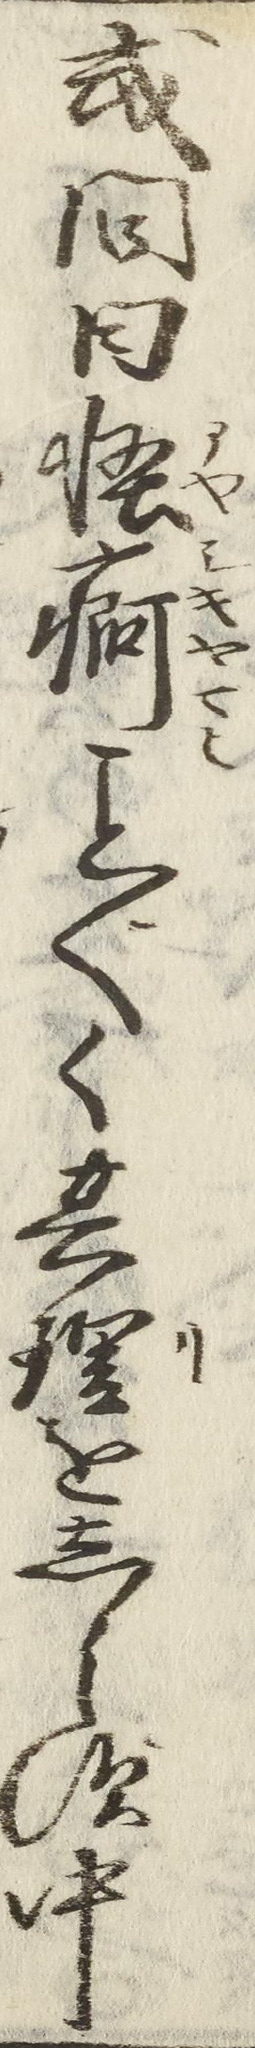或問曰怪痾こと〴〵く其理をしらず中
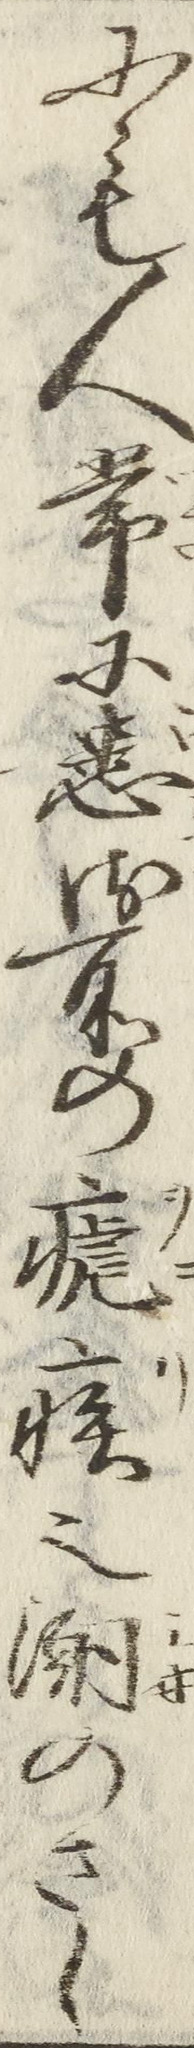にも人常に患る所の瘧疾也潮のさし
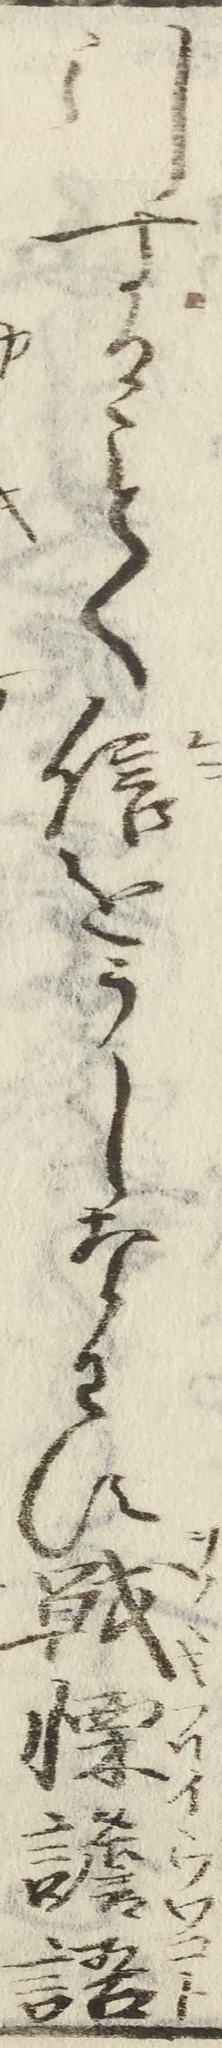引することく信をうしなわす戦慄譫語
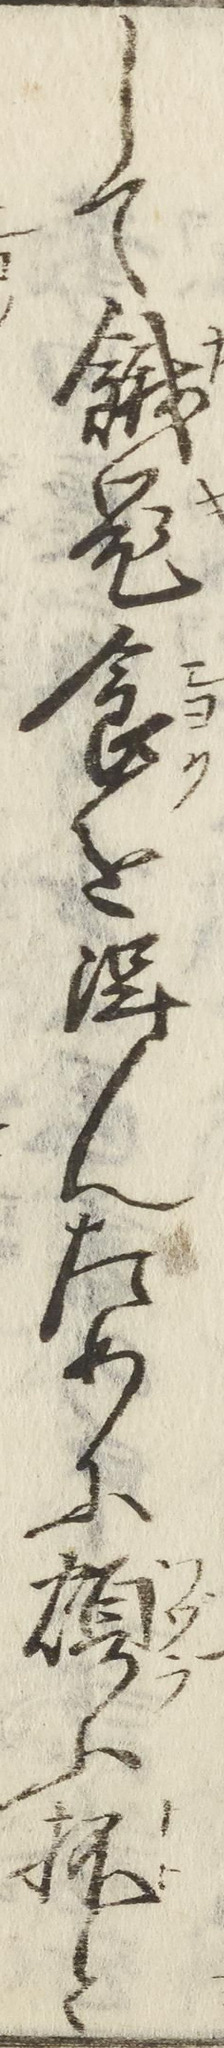して餓鬼食を得んために煩ふ抔と
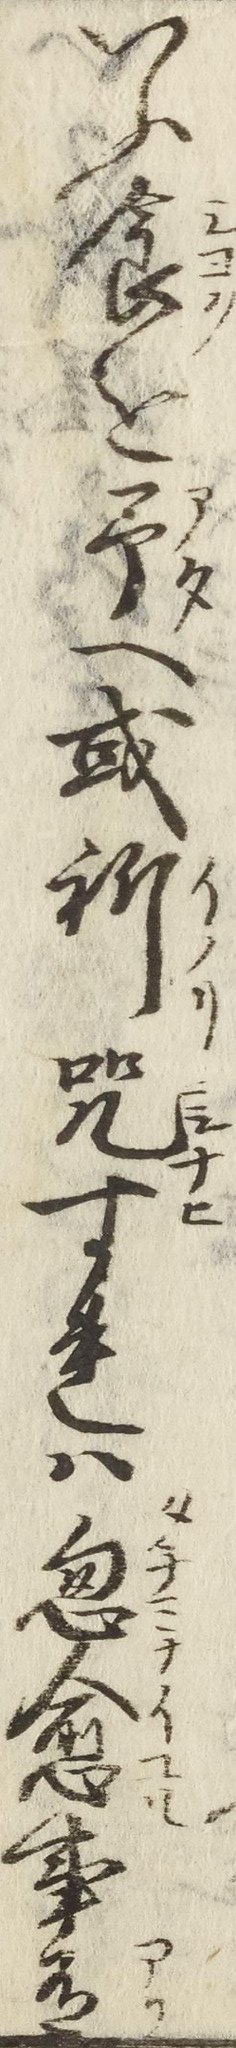いふ食を予へ或祈呪すれは忽愈事有

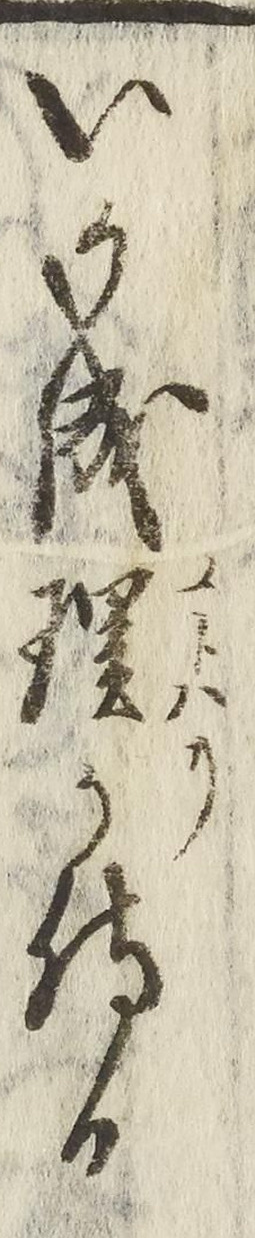いか成理か侍る
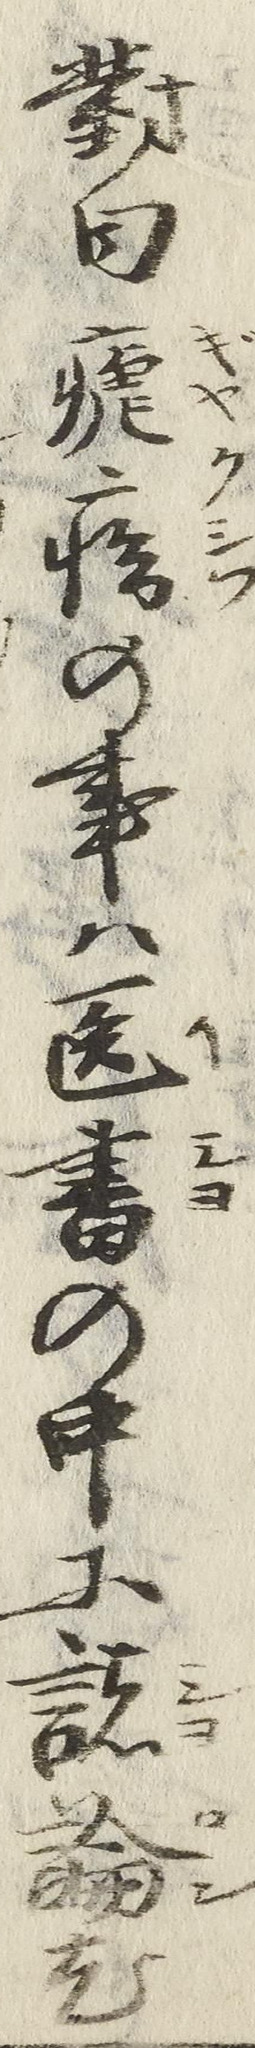対曰瘧疾の事ハ医書の中に諸論尤
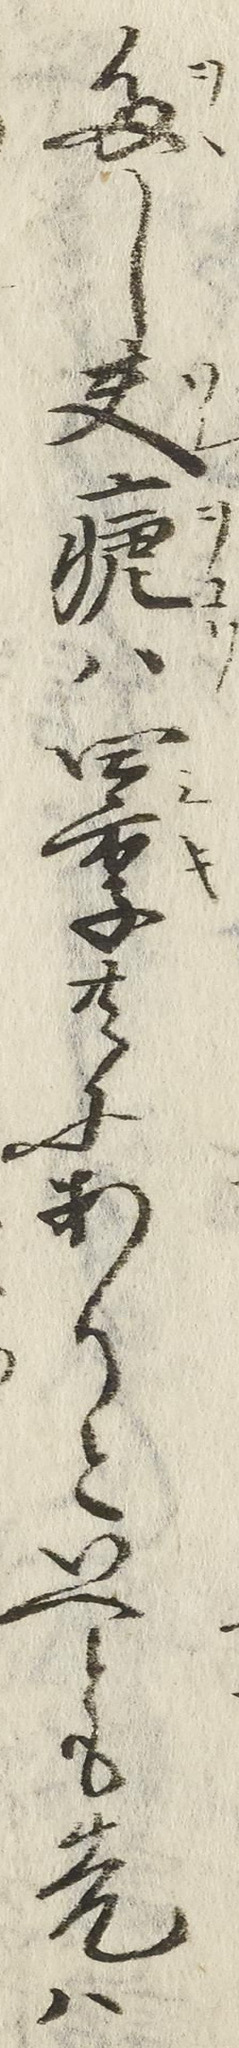多し夫瘧は四季共にありといへとも先は
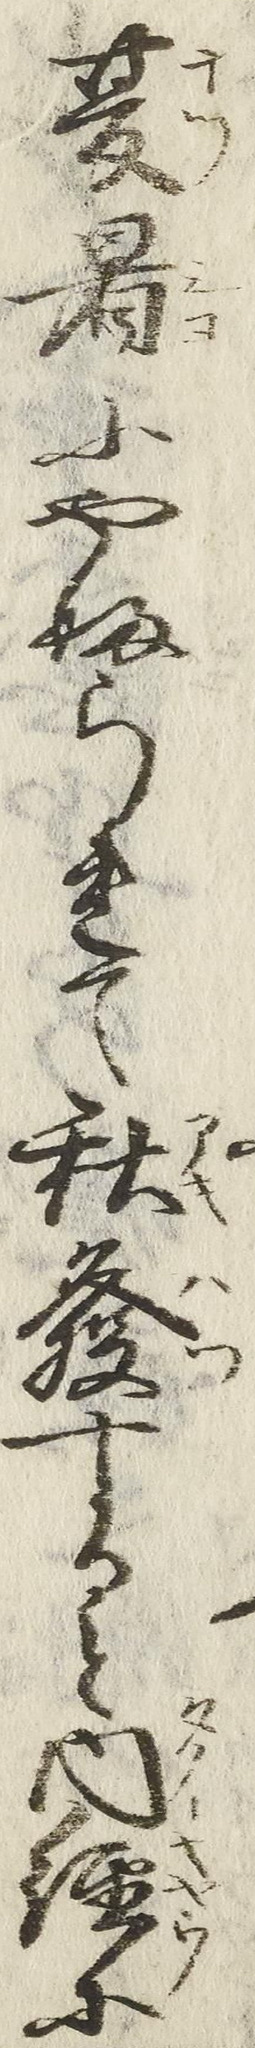夏暑にやふられて秋発すると内経に
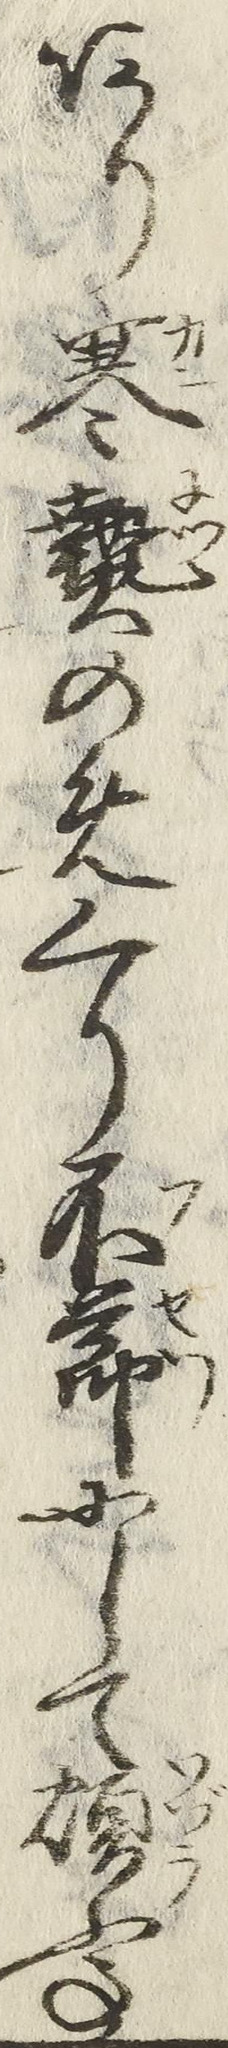あり寒熱のめくり不節にして煩ふ事
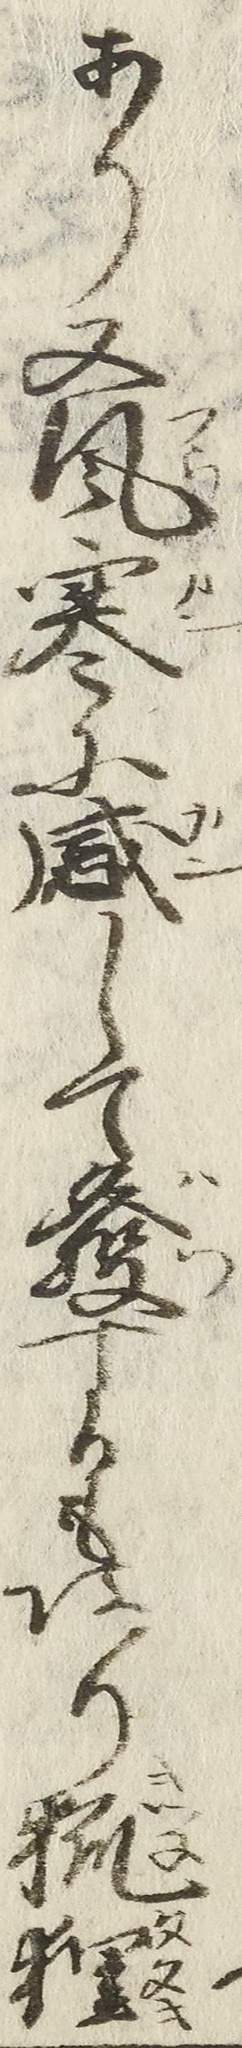あり又風寒に感して発するもあり狐貍
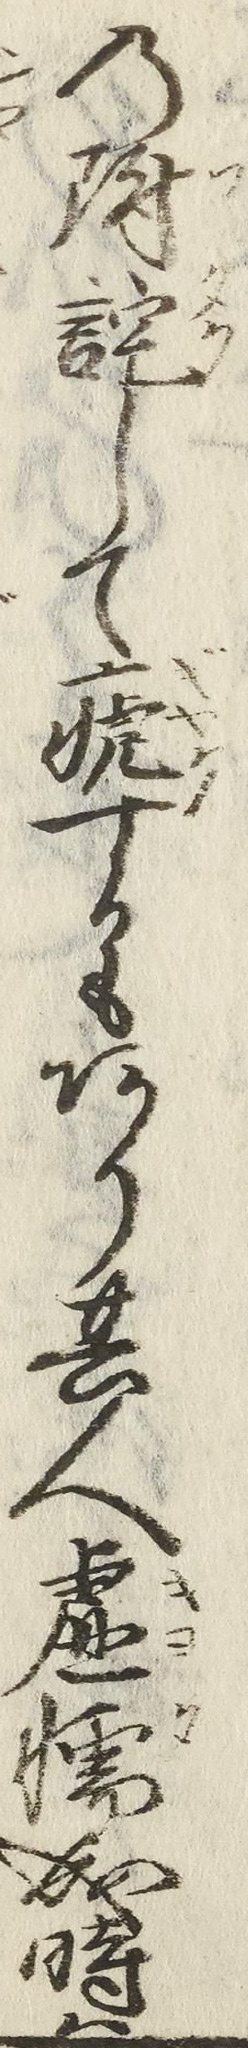の附詫して瘧するもあり其人虚懦成時は
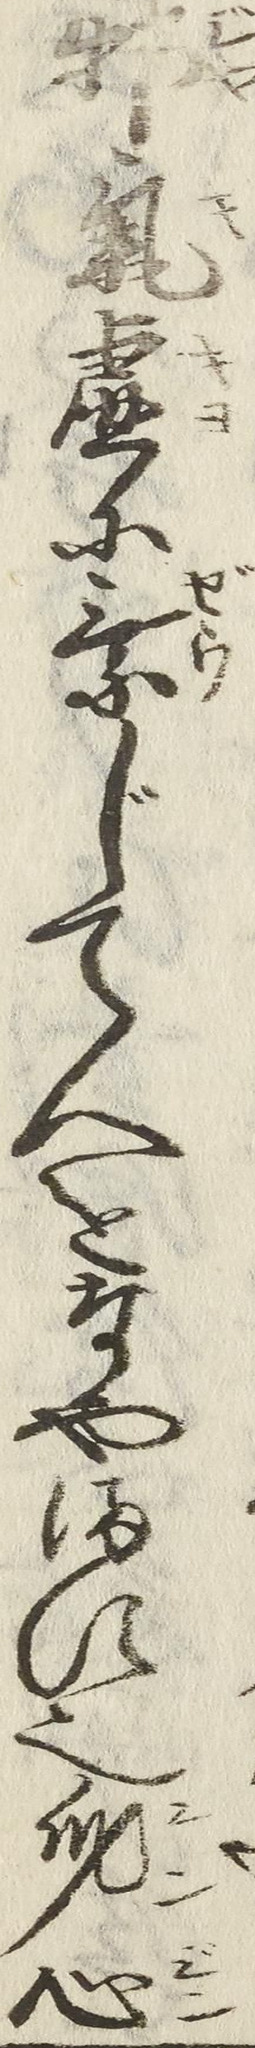邪気虚に乗じて人をなやます也身心
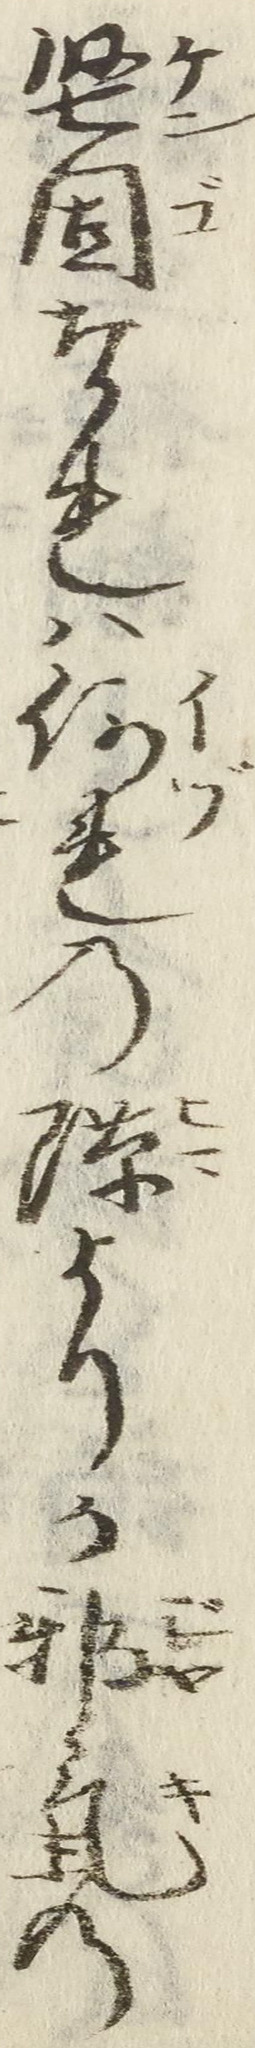堅固なれは何れの隙よりか邪気の
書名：天地或問珍　地
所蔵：東京大学地震研究所図書室 Earthquake Research Institute Library, The University of Tokyo, JAPAN
